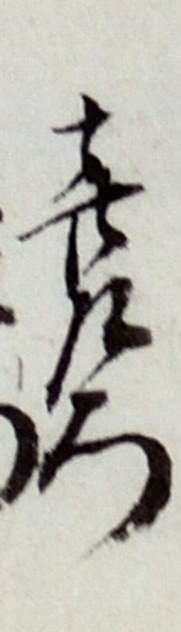喜左衛門
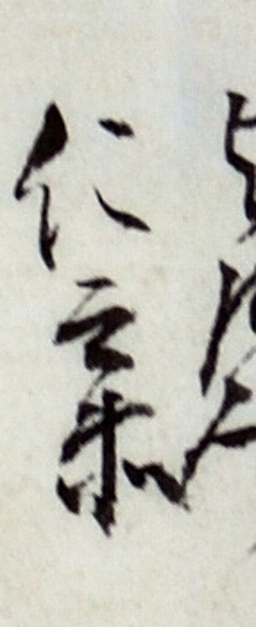仁兵衛
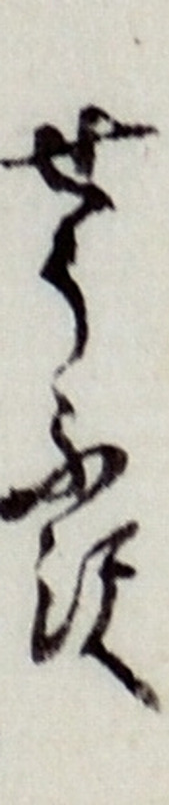せうふ沢
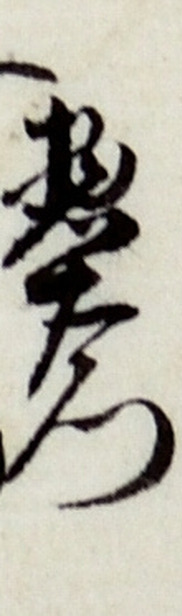庄右衛門
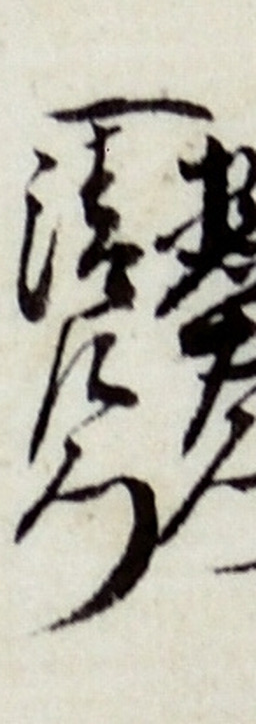清左衛門
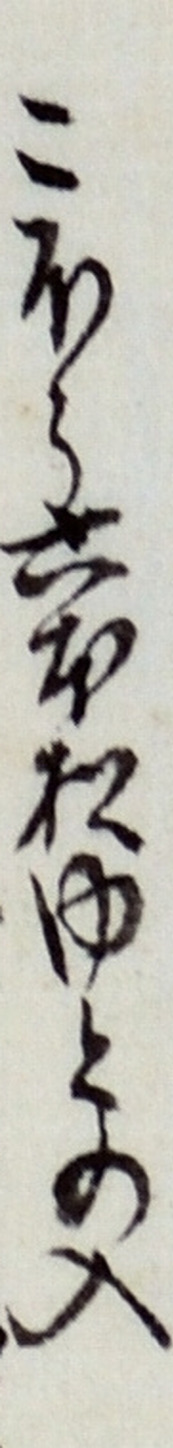こほう六本松ゆとの入
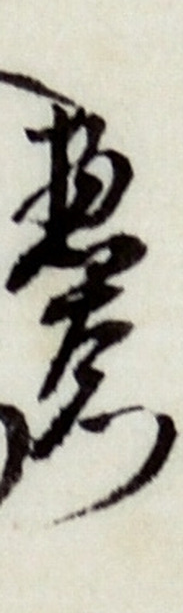庄右衛門
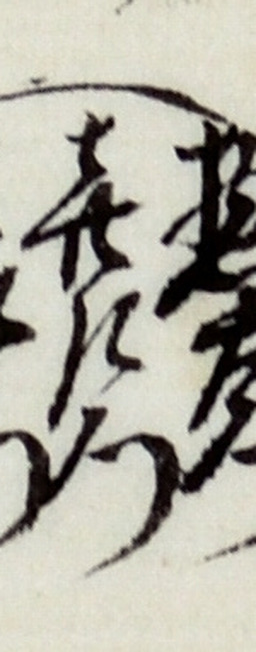喜左衛門
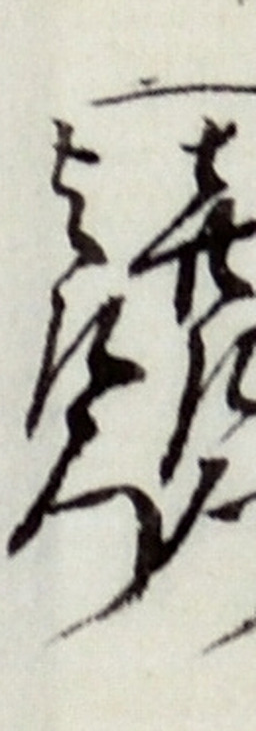与左衛門
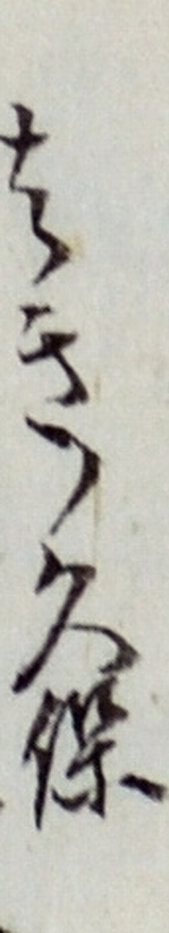さき久保
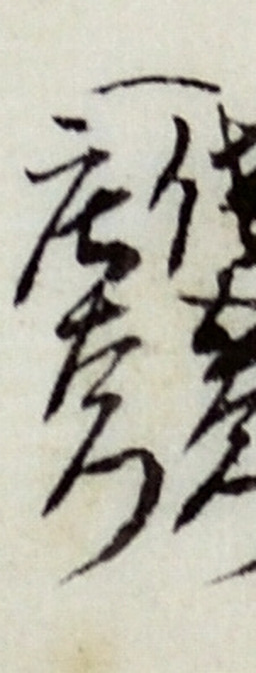庄右衛門
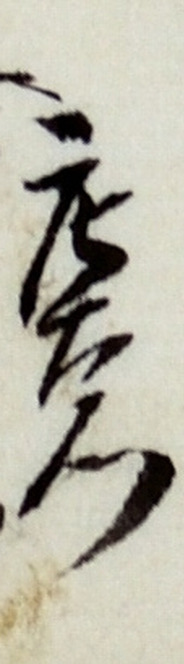庄右衛門
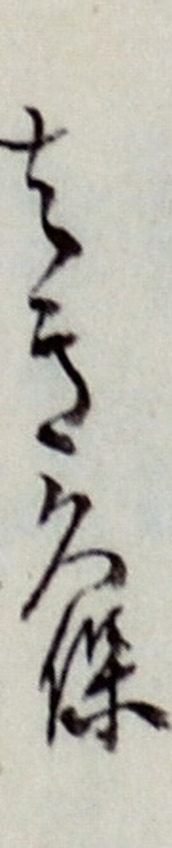さき久保
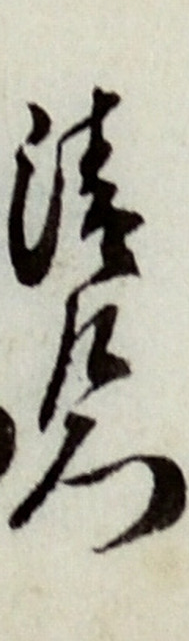清左衛門
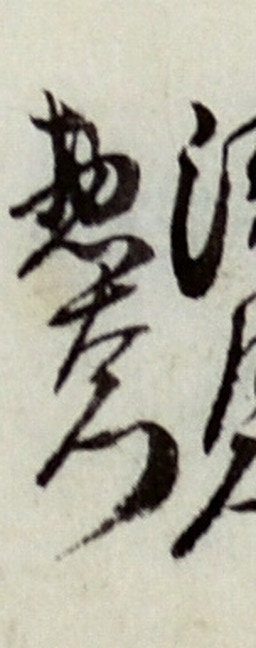庄右衛門
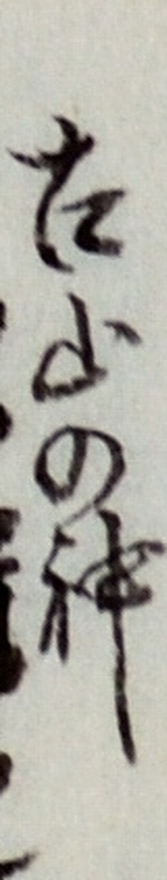古山の神
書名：御領分中山林社地手控
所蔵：伊那市立高遠町図書館・合同会社AMANE
